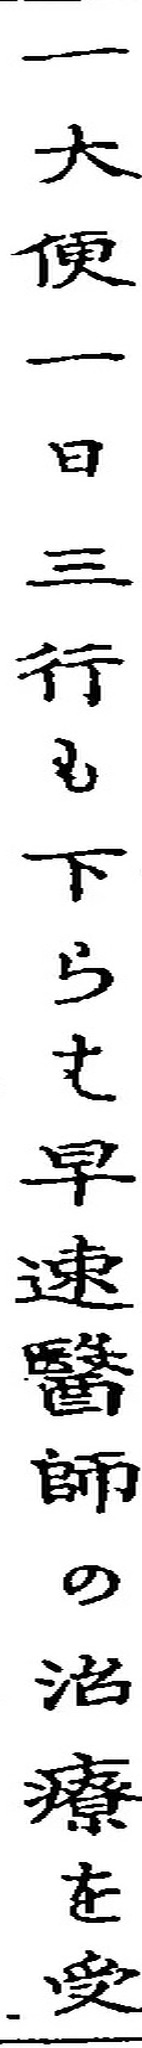一大便一日三行も下らす早速醫師の治療を受
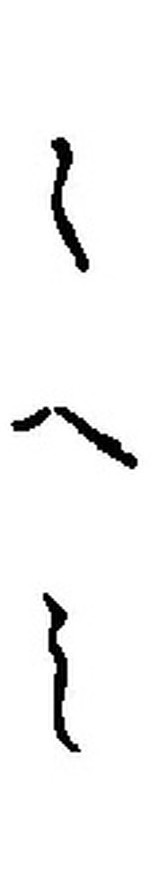くへし
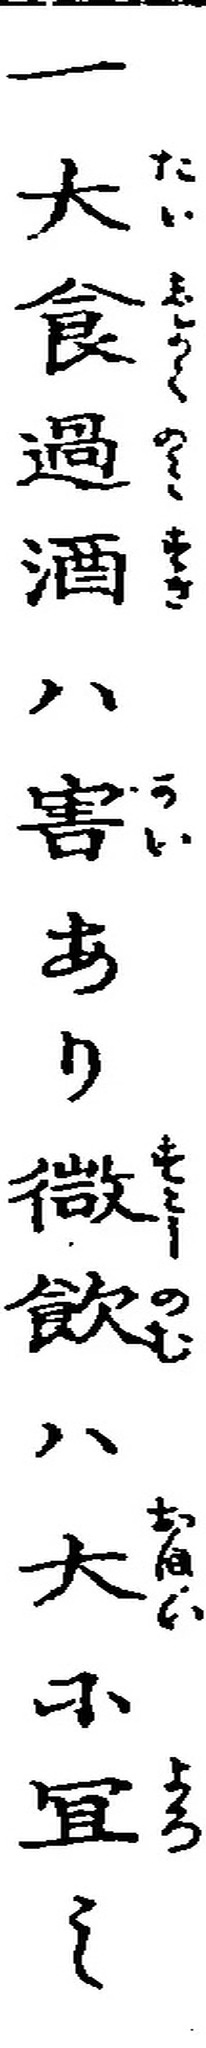一大食過酒は害あり微飲は大に宜し
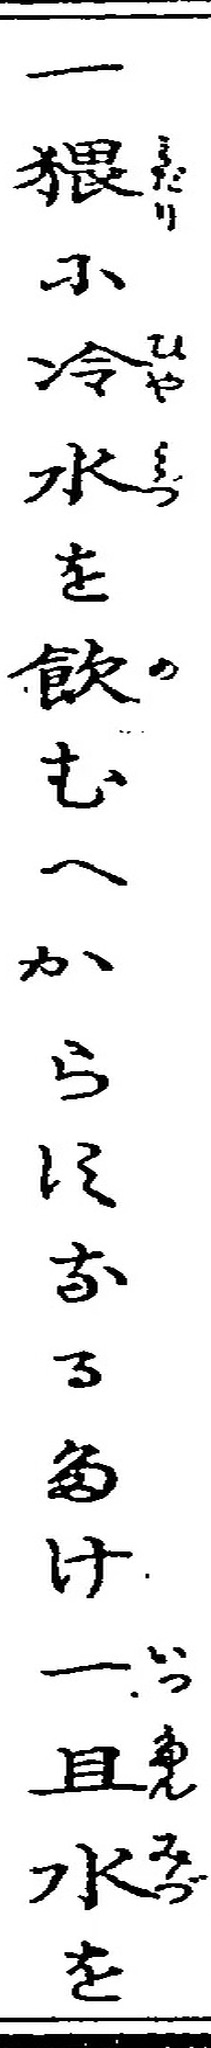一猥に冷水を飲むへからずなるたけ一旦水を
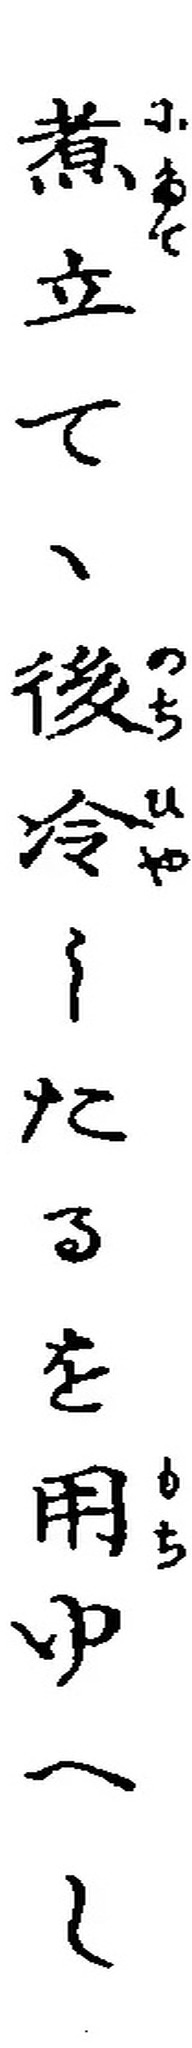煮立てゝ後冷したるを用ゆへし
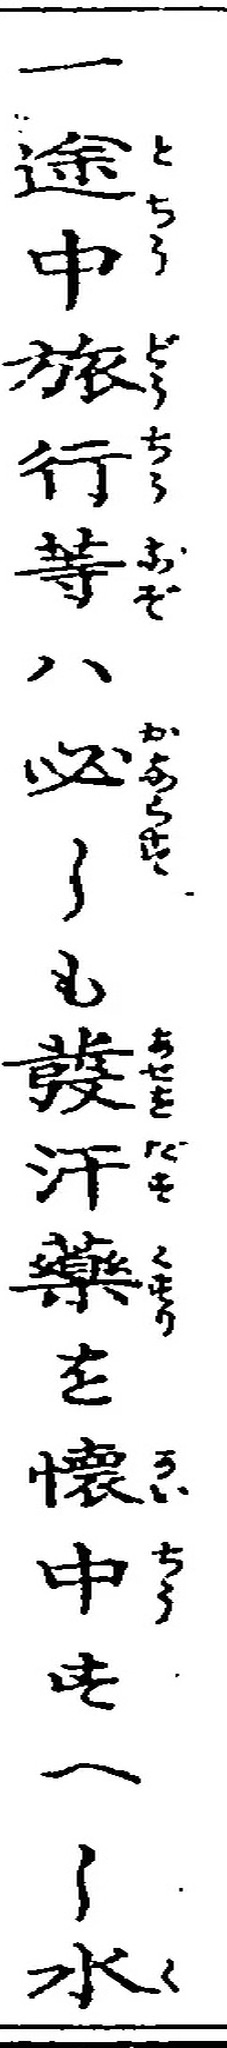一途中旅行等は必しも発汗藥を懐中すへし水
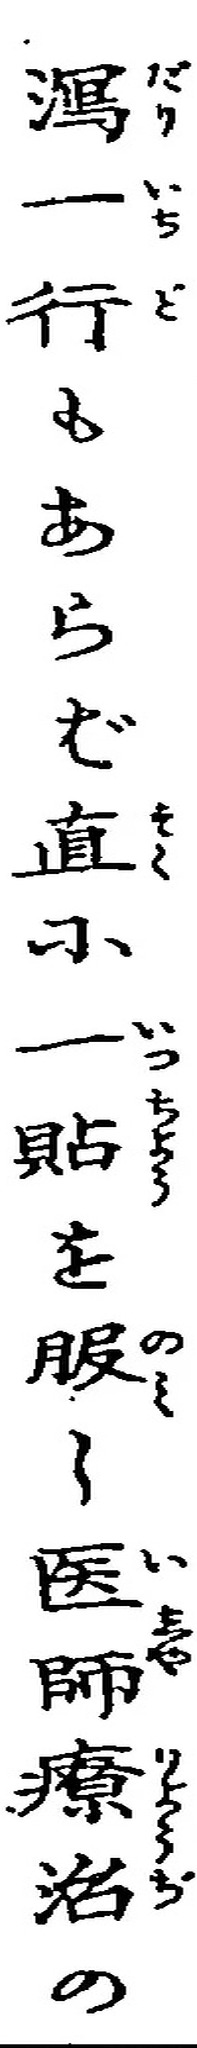瀉一行もあらば直に一貼をを服し医師療治の
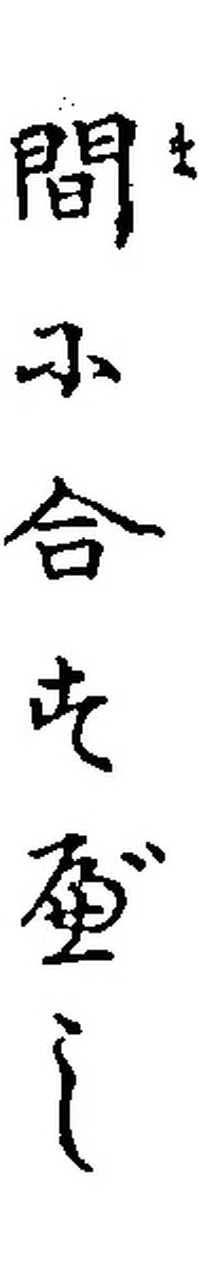間に合すべし
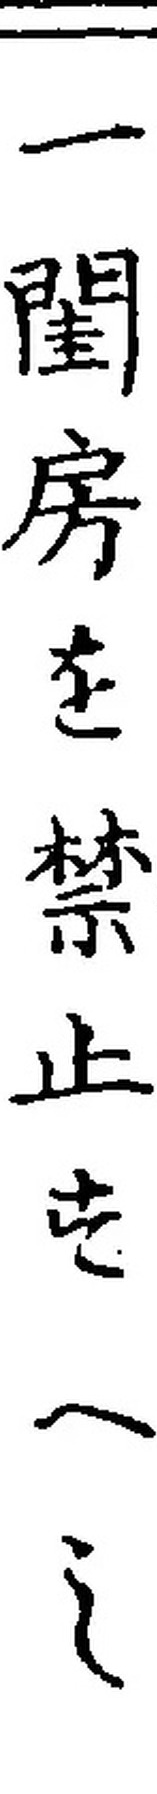一閨房を禁止すへし
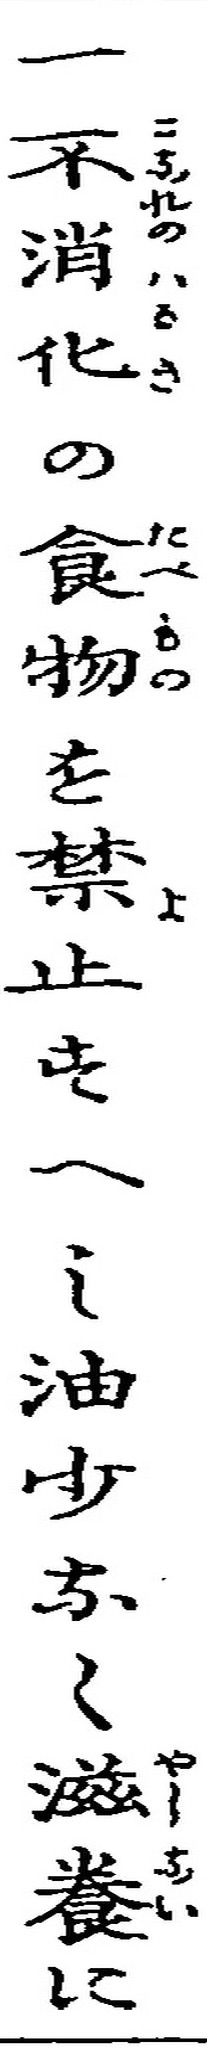一不消化の食物を禁止すへし油少なく滋養に

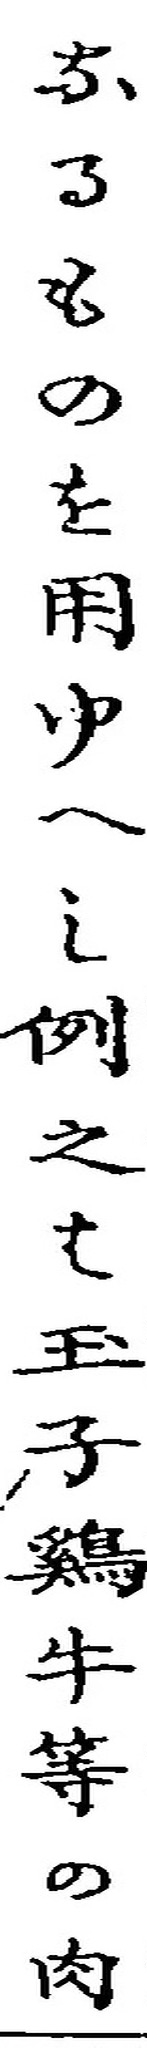なるものを用ゆへし例之は玉子鶏牛等の肉
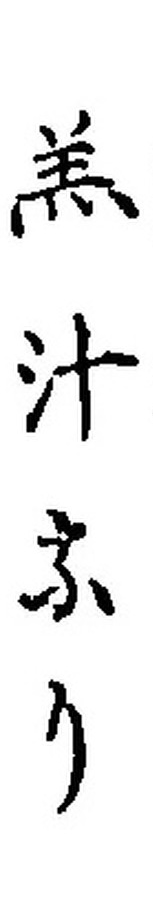羔汁なり
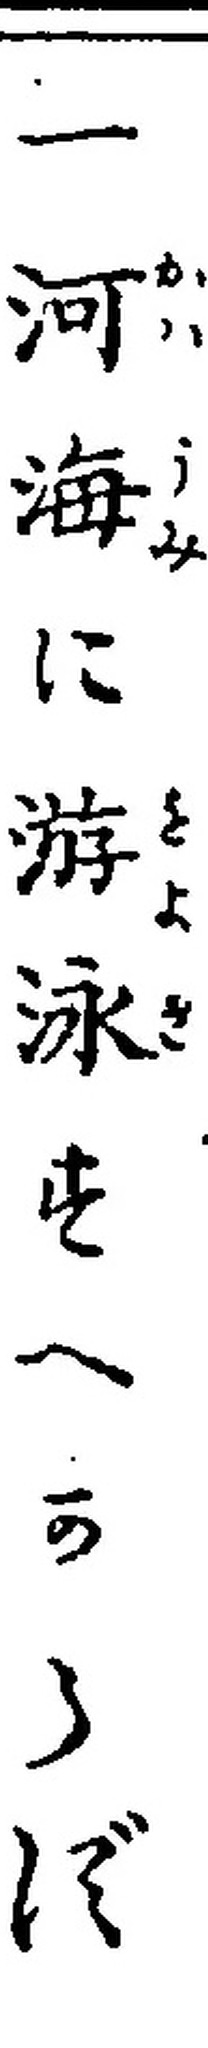一河海に游泳すへからず
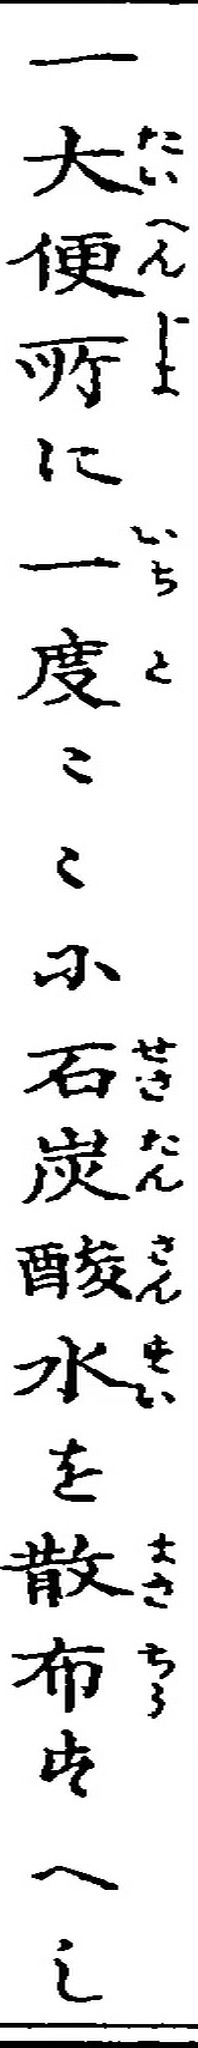一大便所に一度こゝに石炭酸水を散布すへし
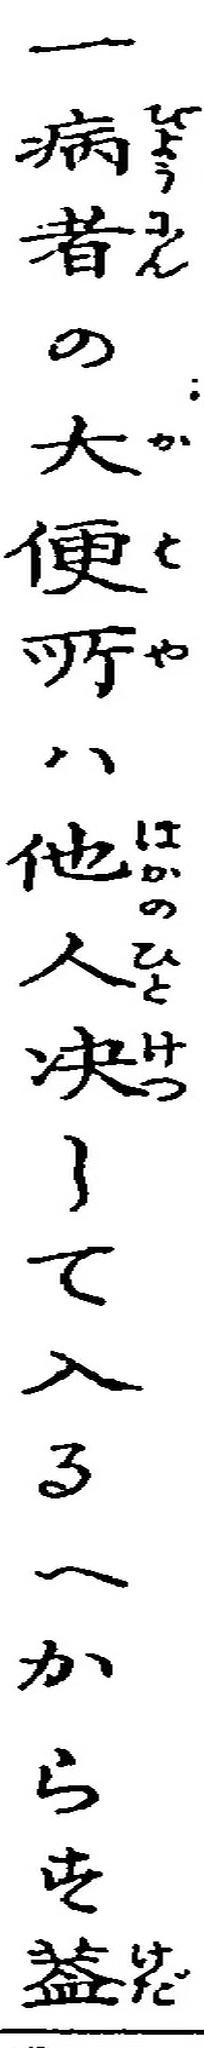一病者の大便所は他人決して入るへからす蓋
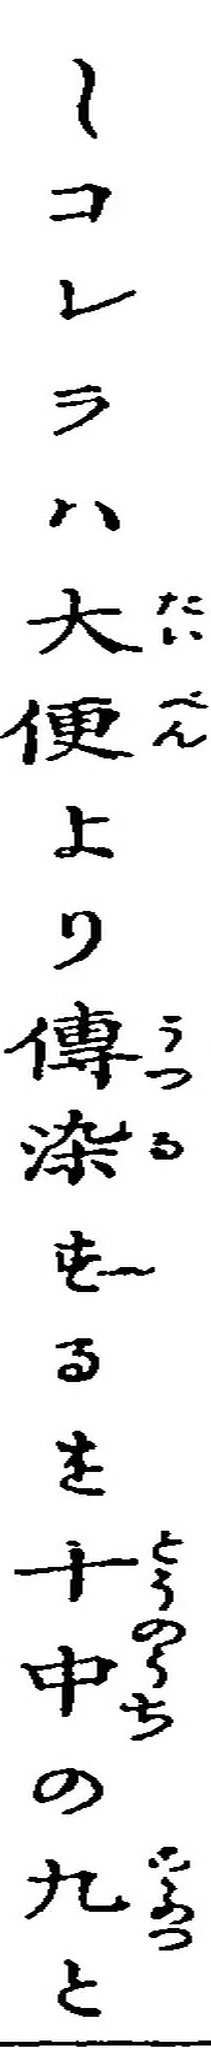しコレラは大便より傳染するを十中の九と
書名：虎列剌予防民間の心得
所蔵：国立国会図書館 National Diet Library, JAPAN
